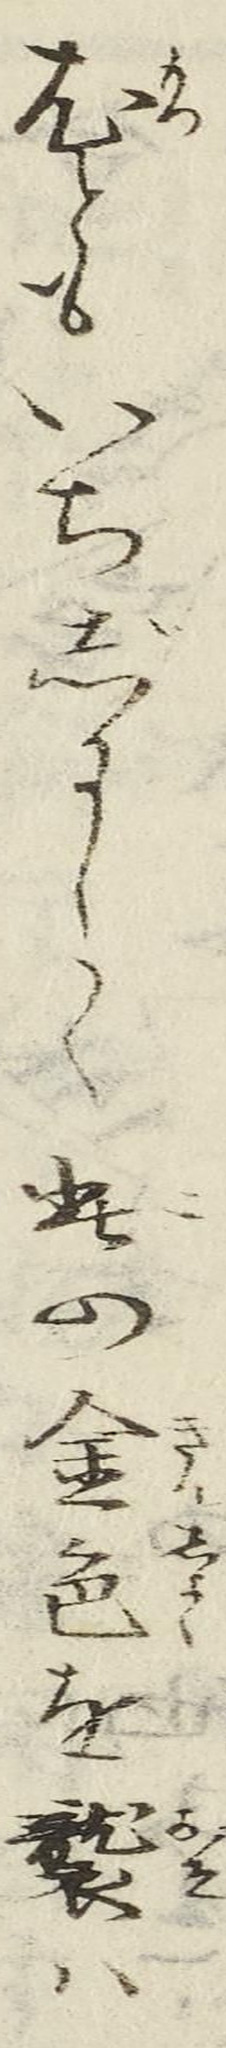尤ともいちじるしく此の金色を襲は
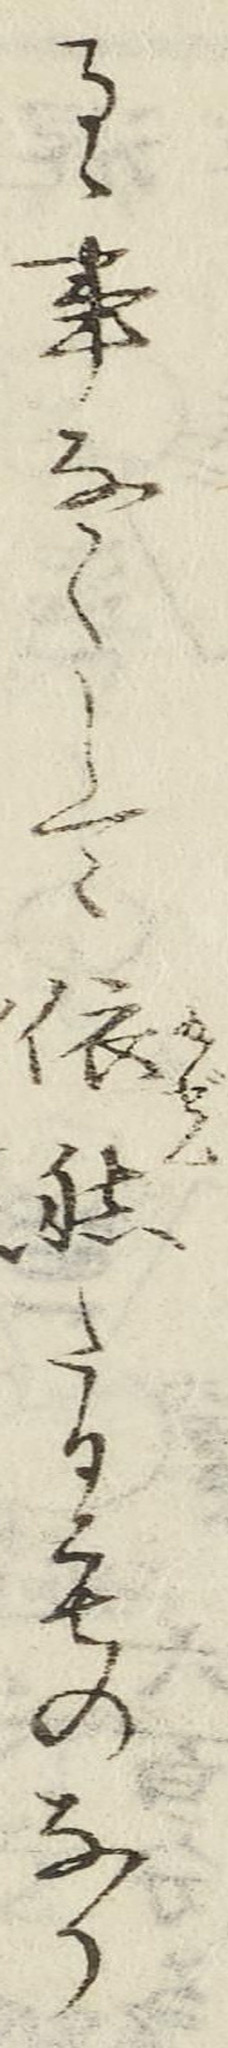るゝ事なくして依然たるものなり
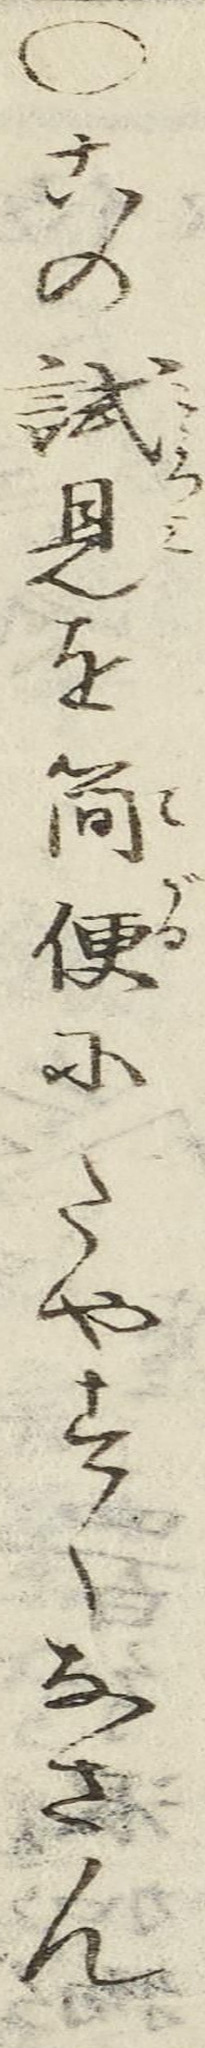○この試見を簡便にたやすくなさん
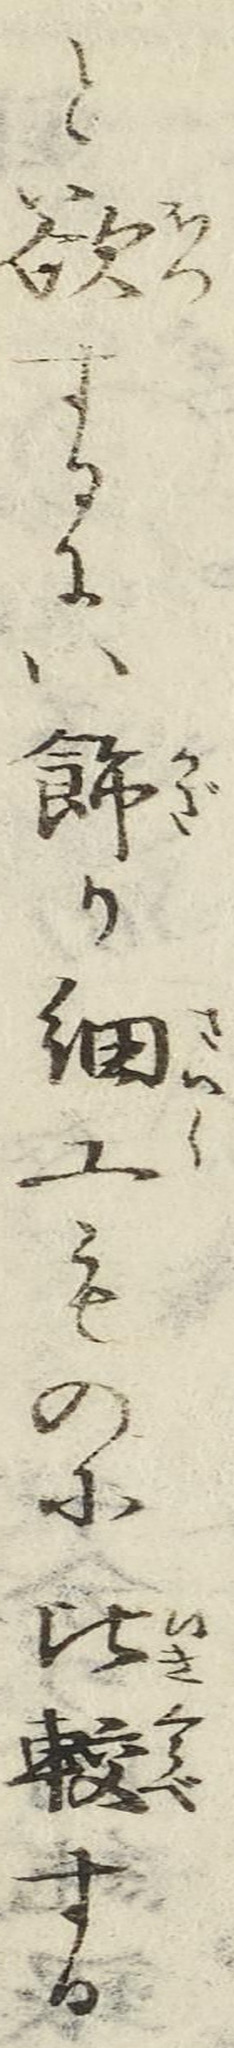と欲するには飾り細工ものに比較する
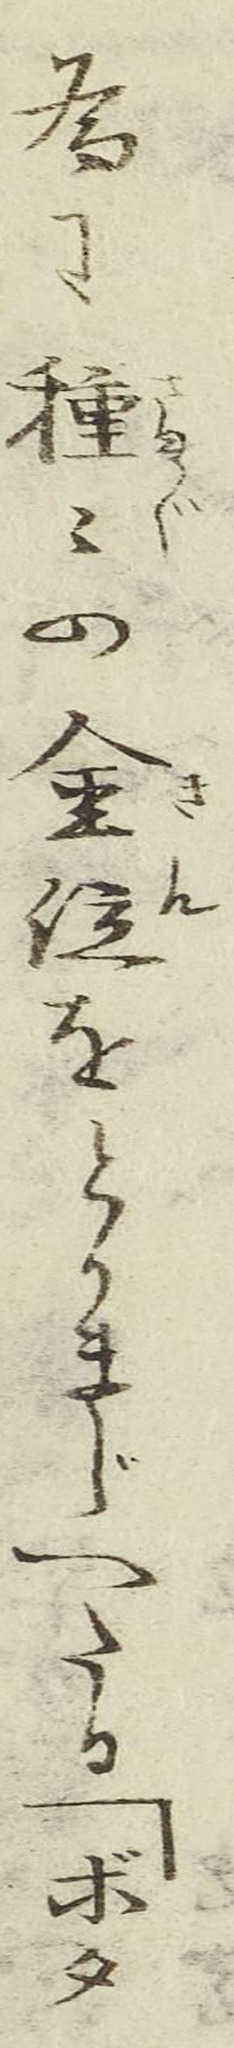為に種〻の金位をとりまじへたる「ボタ

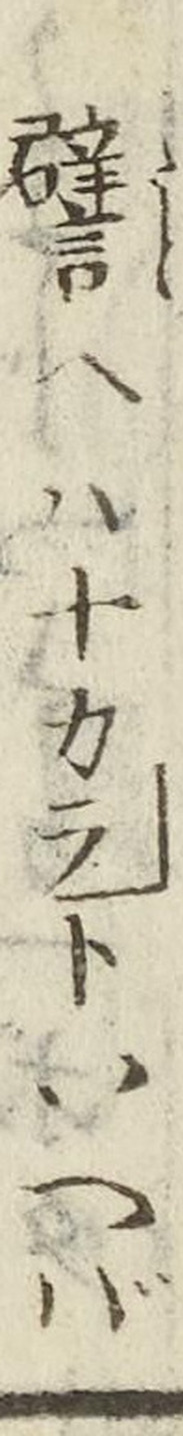譬へは十カラ」といへば
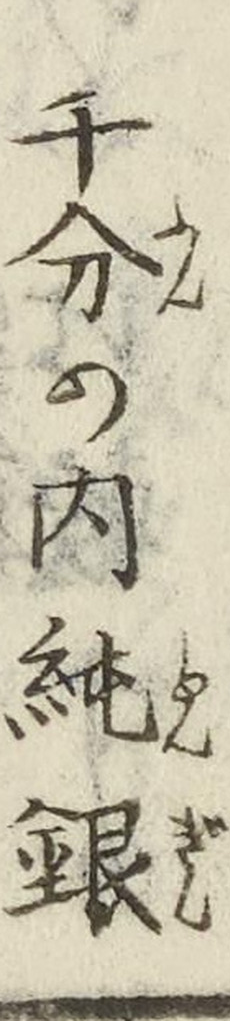千分の内純銀
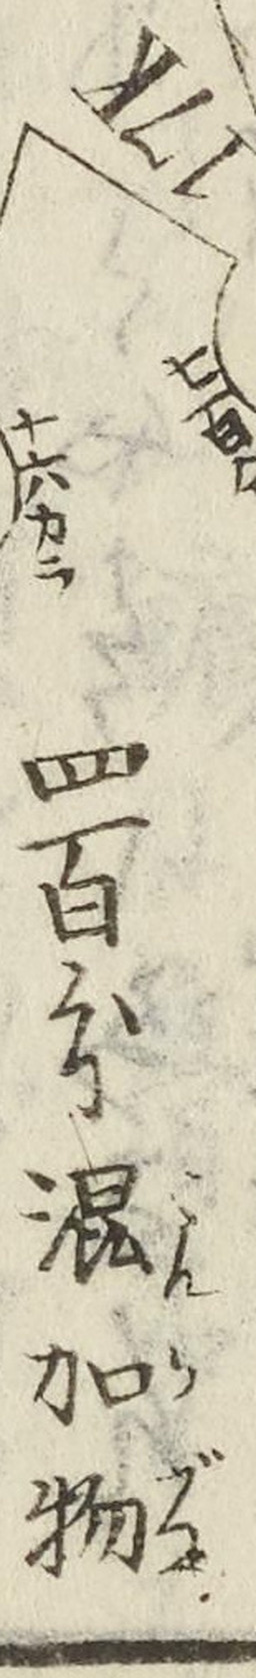四百分混加物
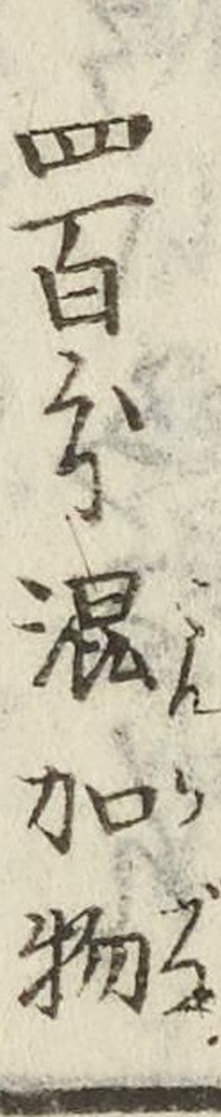四百分混加物
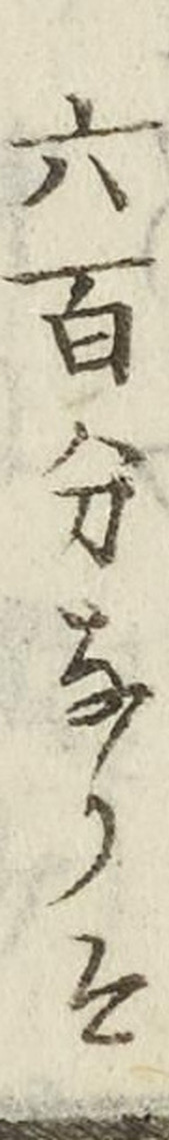六百分なりそ
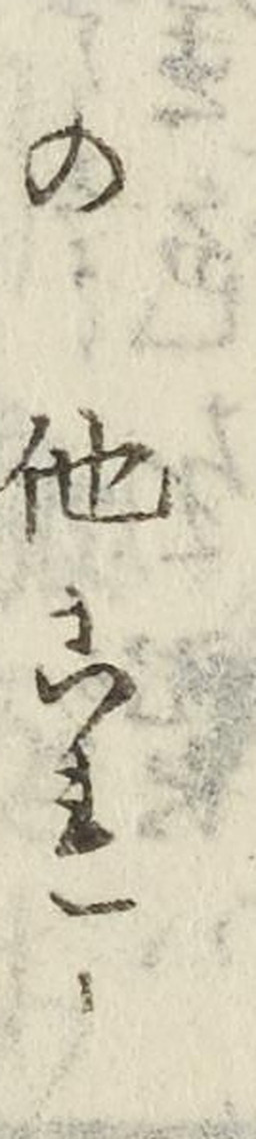の他これ
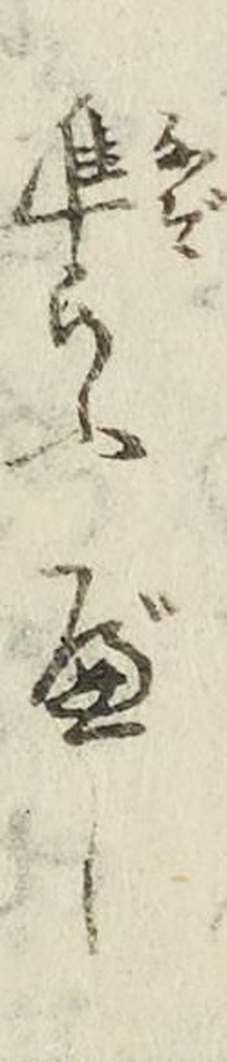準らふべし
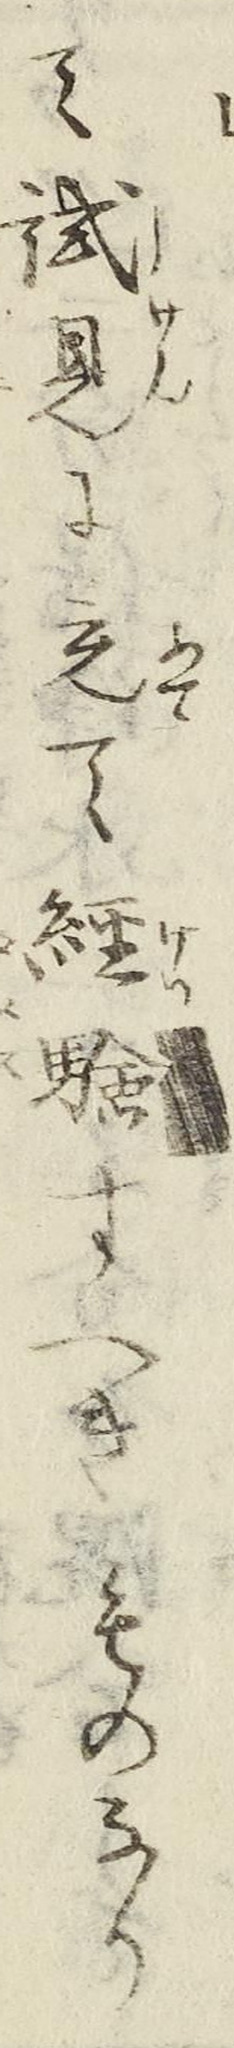て試見に充て経験すへきものなり
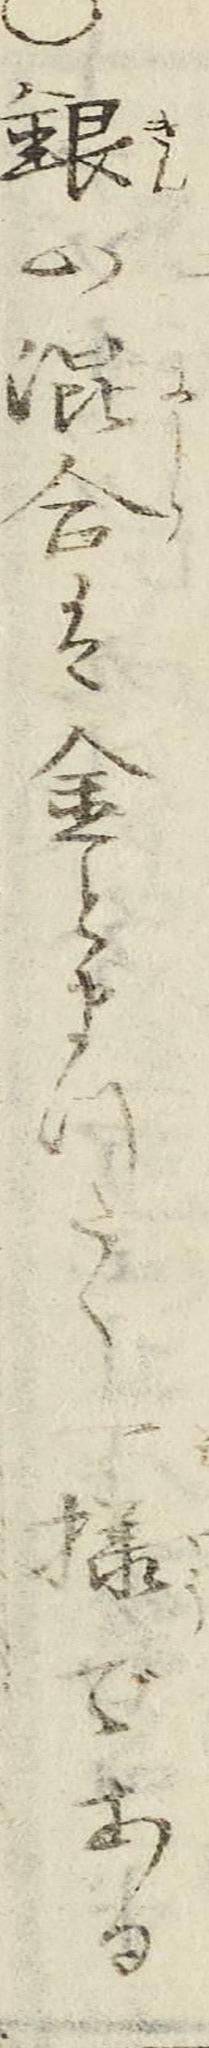○銀の混合は金とまつたく同様である
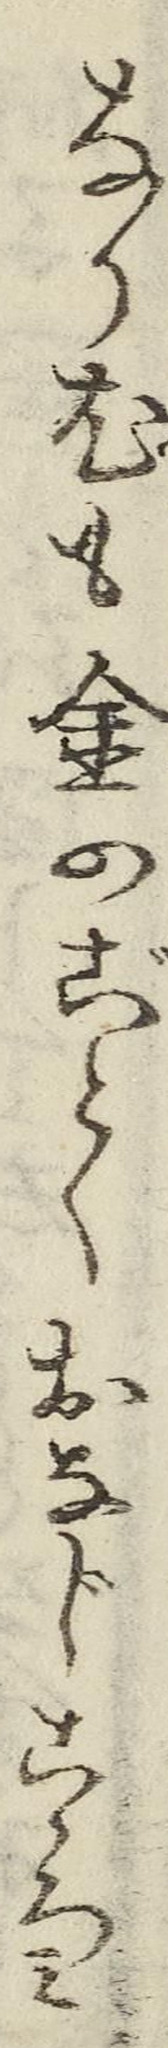なり尤も金のごとくおなじこゝろみ
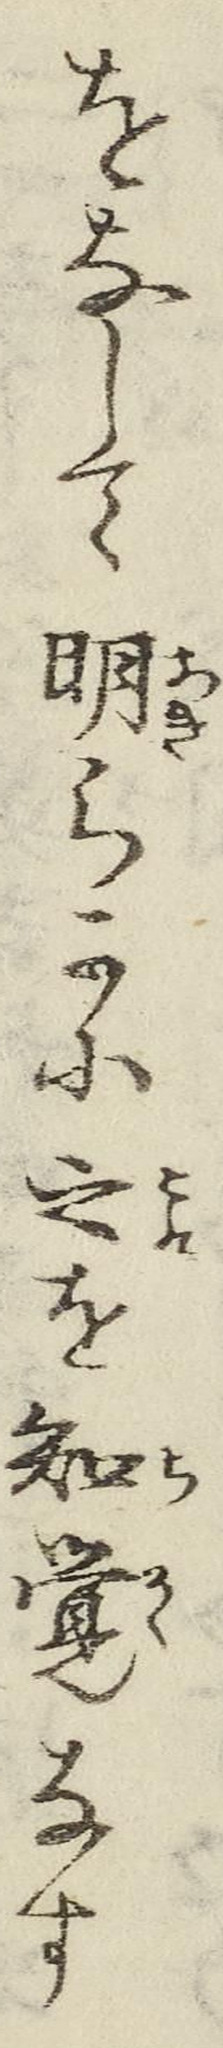をなして明らかに之を知覚なす
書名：[時計に関する冊子]
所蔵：東京大学地震研究所図書室 Earthquake Research Institute Library, The University of Tokyo, JAPAN
